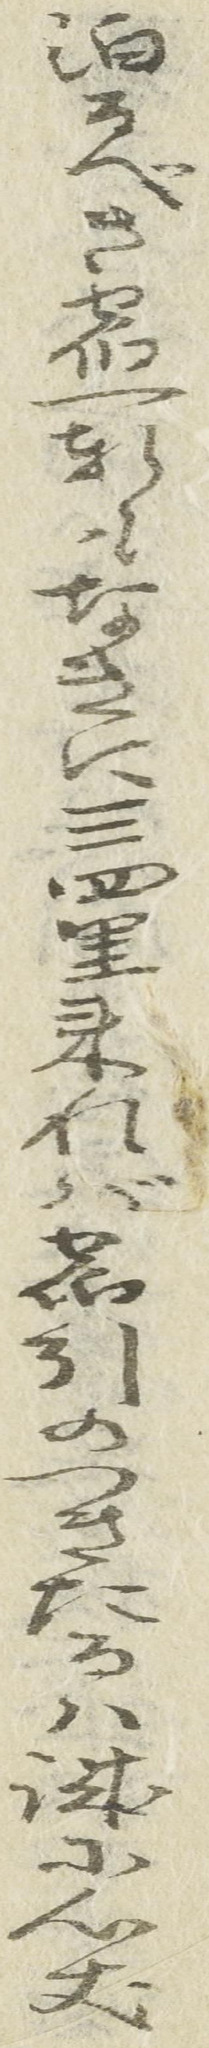泊るべき宿一軒もなきに三四里来れば宿引のつきたるは誠に心丈
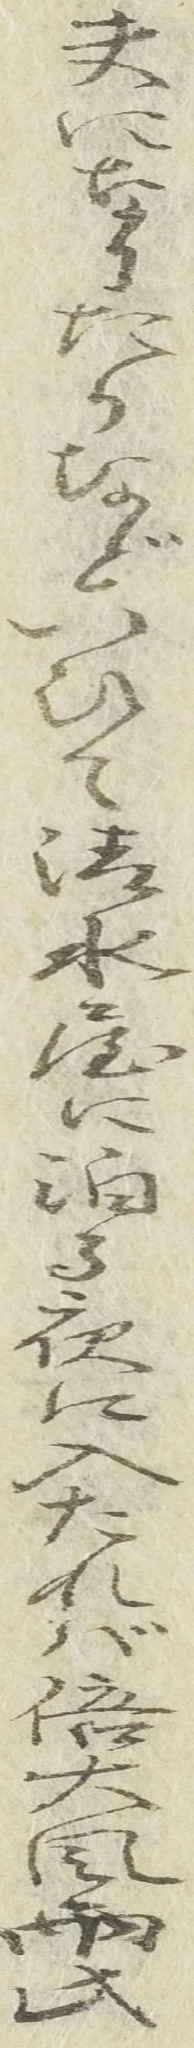夫になりたりなどいひて清水屋に泊る夜に入りたれば倍大風雨此
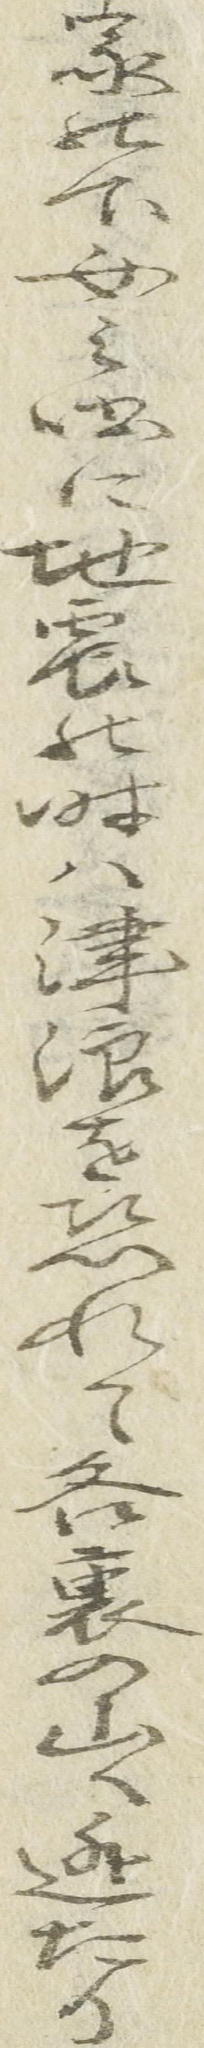家の下女の咄に地震の時は津浪を恐れて各裏の山へ逃たり
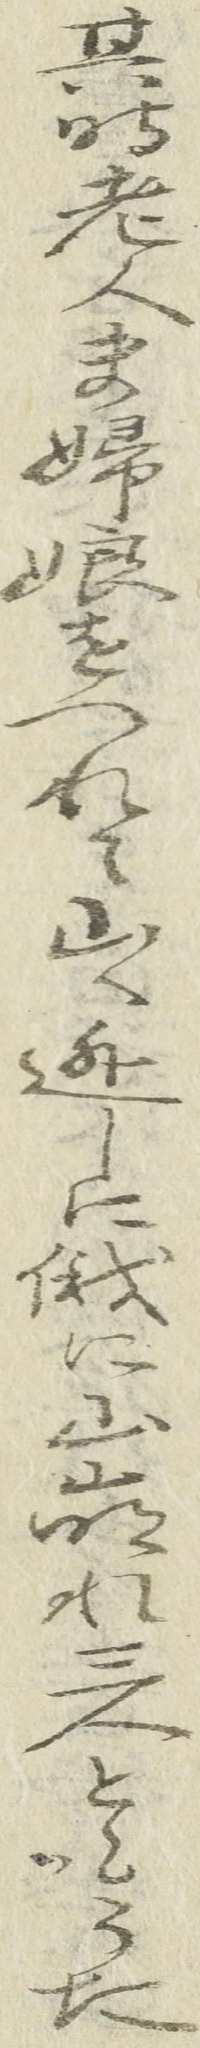其時老人夫婦娘をつれて山へ逃しに俄に山崩れ三人ともうた
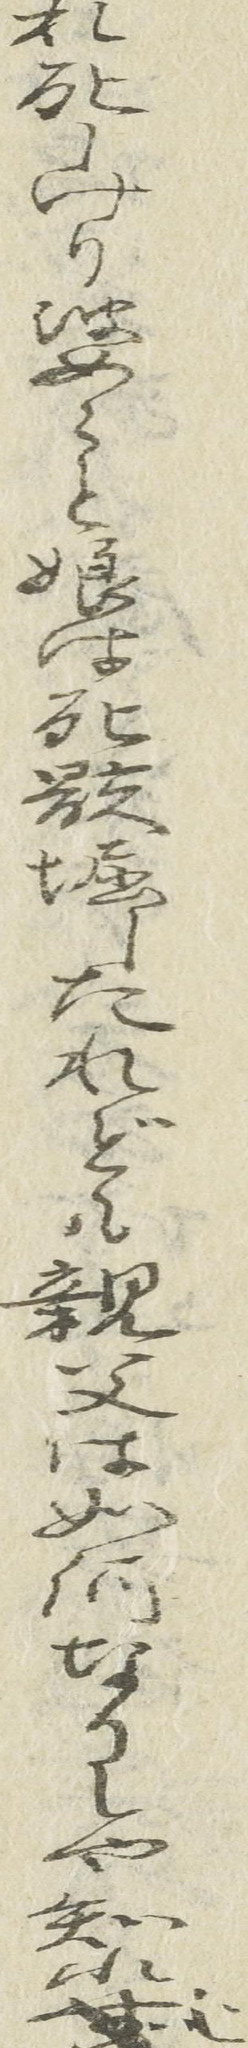れ死しけり婆〻と娘は死骸堀したれども親父は如何なりしや知れじ
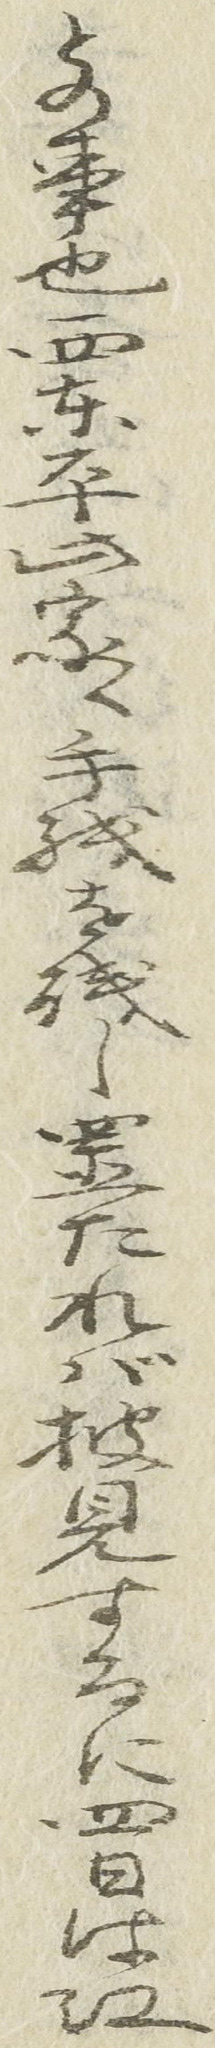との事也西東平此家へ手紙を残し置たれば披見するに四日は江
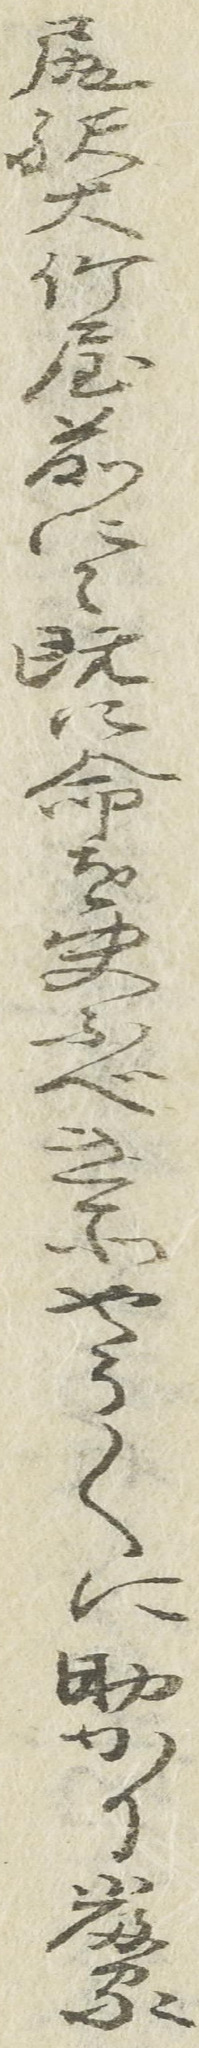尻駅大竹屋前にて既に命を失ふべき所やう〳〵に助かり当家
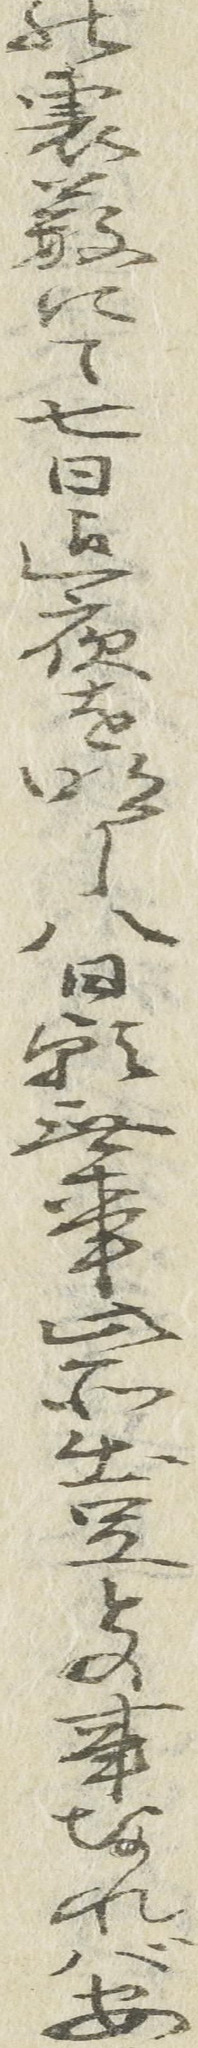の裏薮にて七日迄夜を明し八日朝無事此所出足との事なれば安
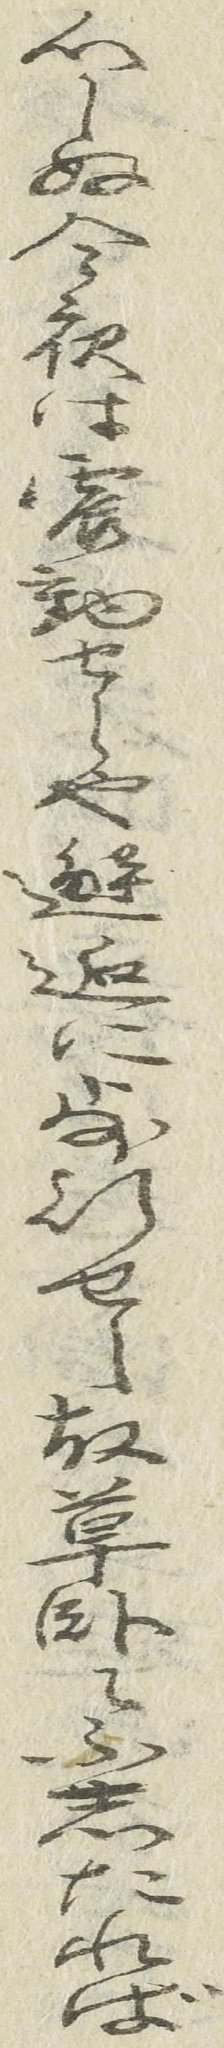心しぬ今夜は震動せしや邂逅に歩行せし故草臥てふしたれば
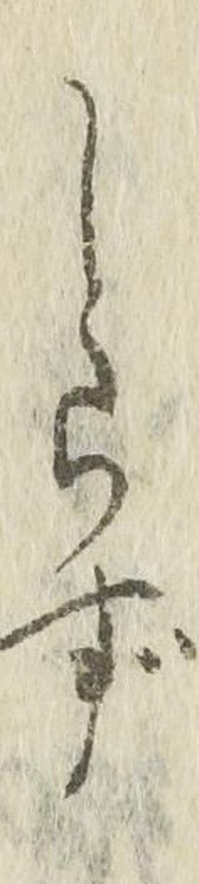しらず
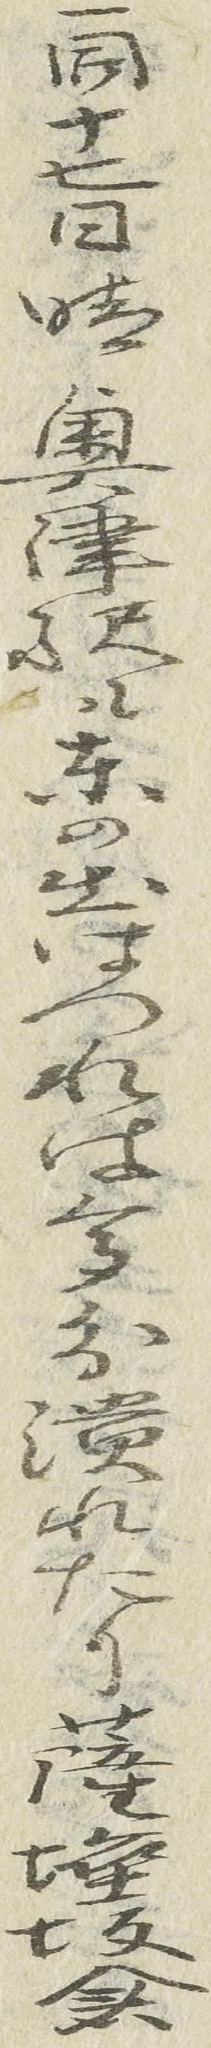一同十七日晴奥津駅も東の出はつれは多分潰れたり薩埵坂倉
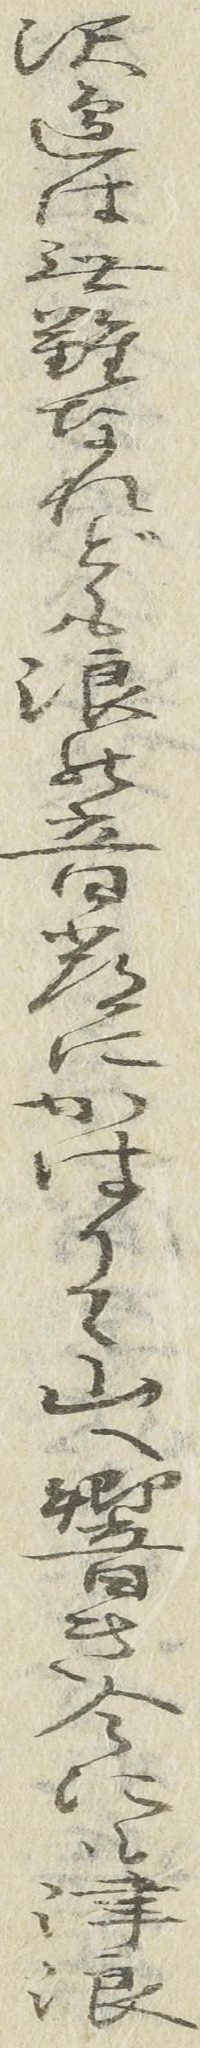沢邊は無難なれども浪の音常にかはりて山へ響き今にも津浪
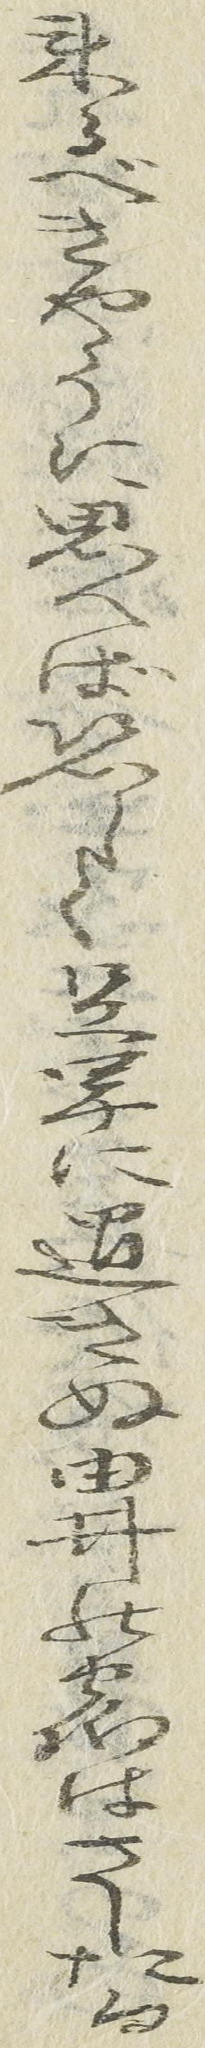来るべきやうに思へば恐しく足早に過きぬ由井の宿はさしたる
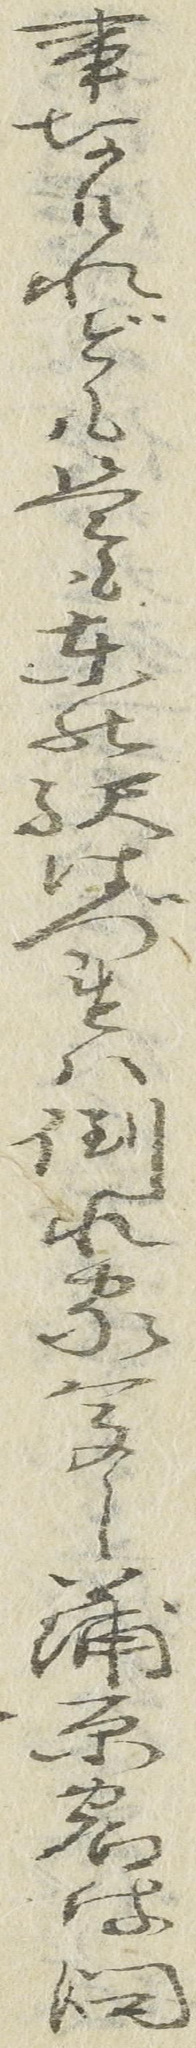事なけれども是も東の沢はづれは倒れ家多し蒲原宿は問
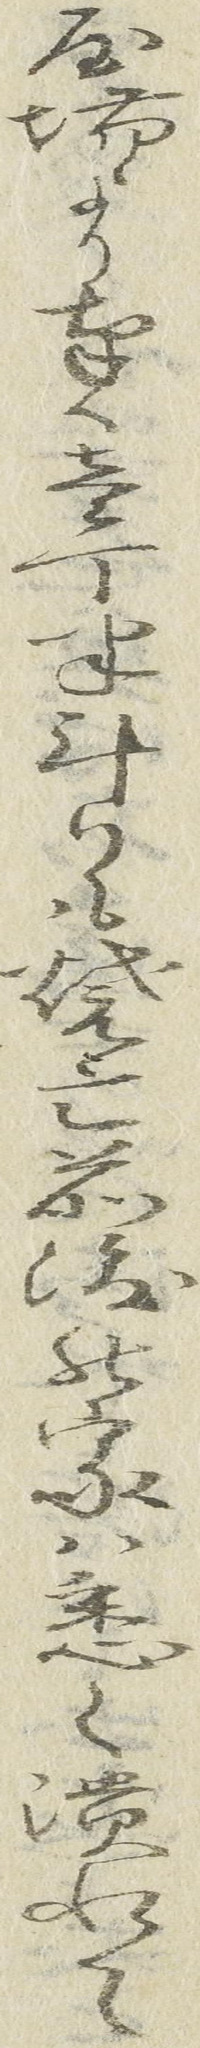屋場より南へ壱丁半斗りも焼亡前後の家は悉く潰れて

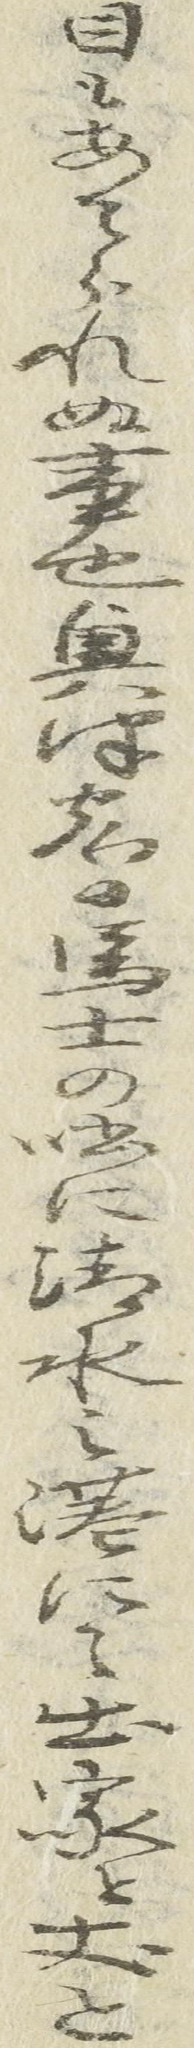目もあてられぬ事也奥津宿の馬士の咄に清水之港にて出家と犬と
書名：地震前兆集　全
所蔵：東京大学地震研究所図書室 Earthquake Research Institute Library, The University of Tokyo, JAPAN
